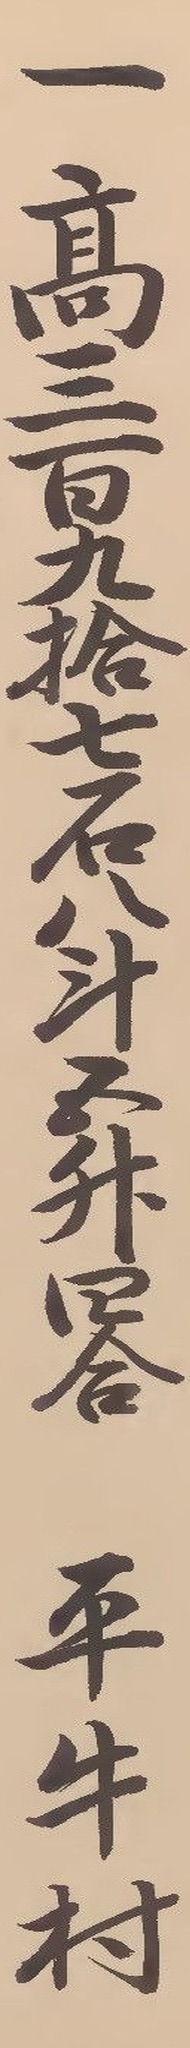一高三百九拾七石八斗五升四合平牛村
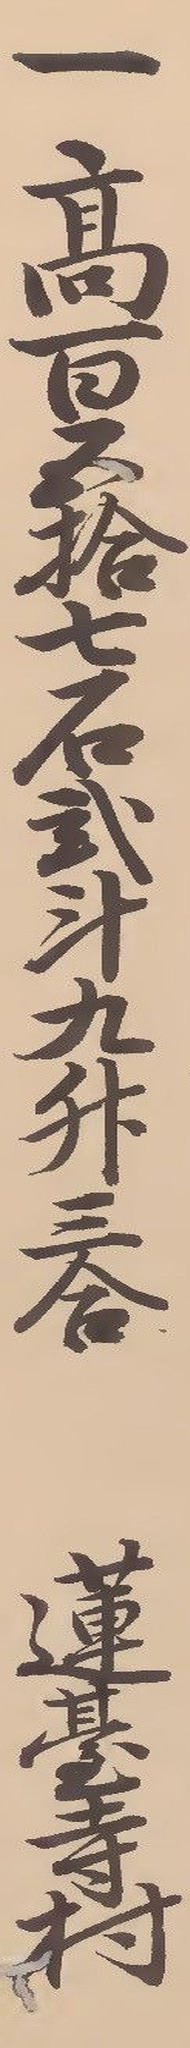一高百五拾七石弐斗九升三合蓮台寺村

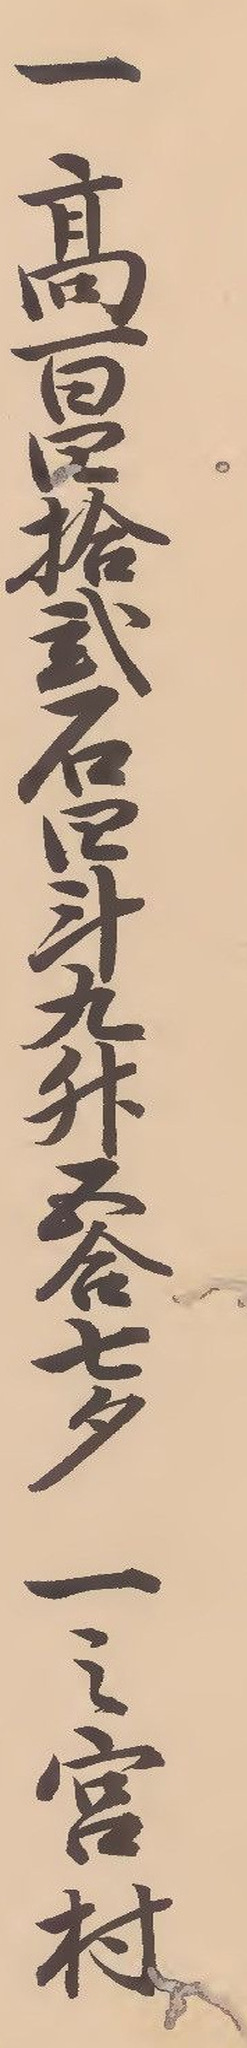一高百四拾弐石四斗九升五合七勺一之宮村
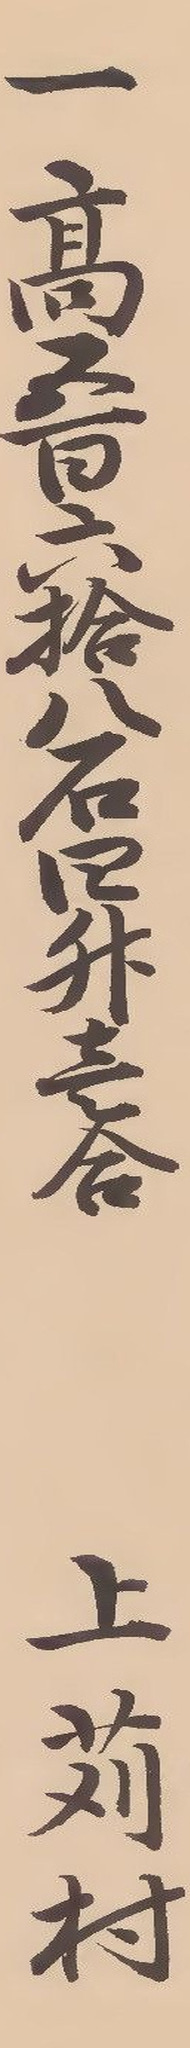一高五百六拾八石四升壱合上苅村
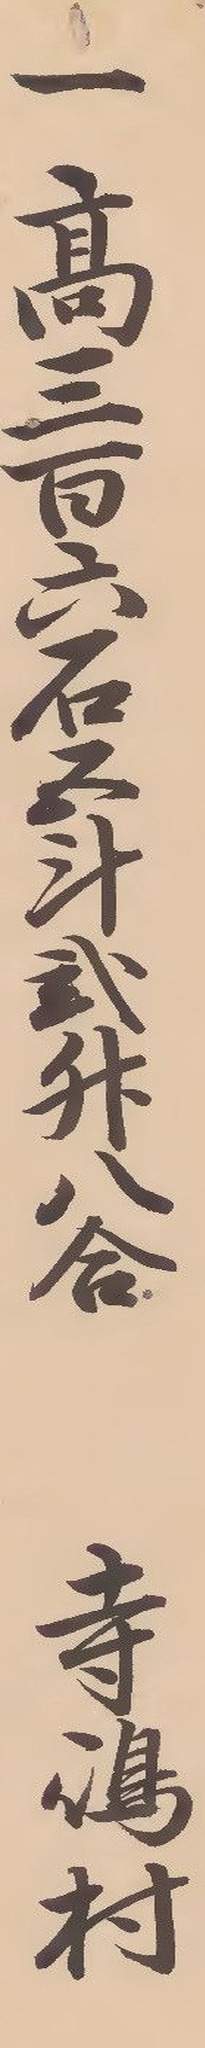一高三百六石五斗弐升八合寺島村
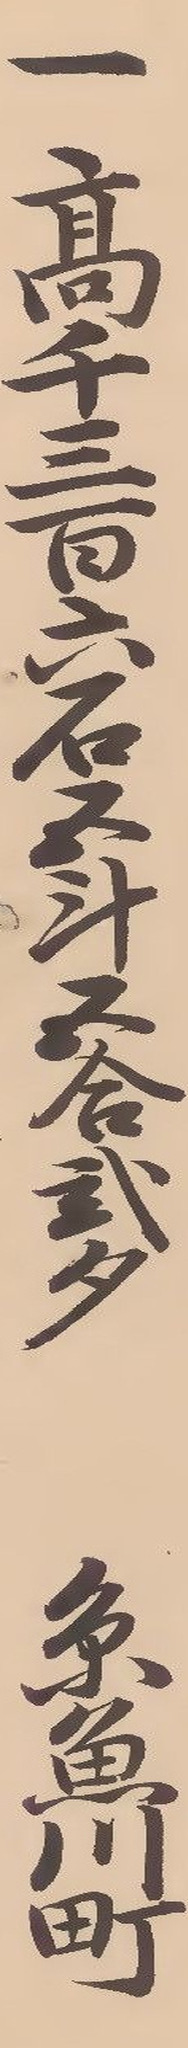一高千三百六石五斗五合弐勺糸魚川町
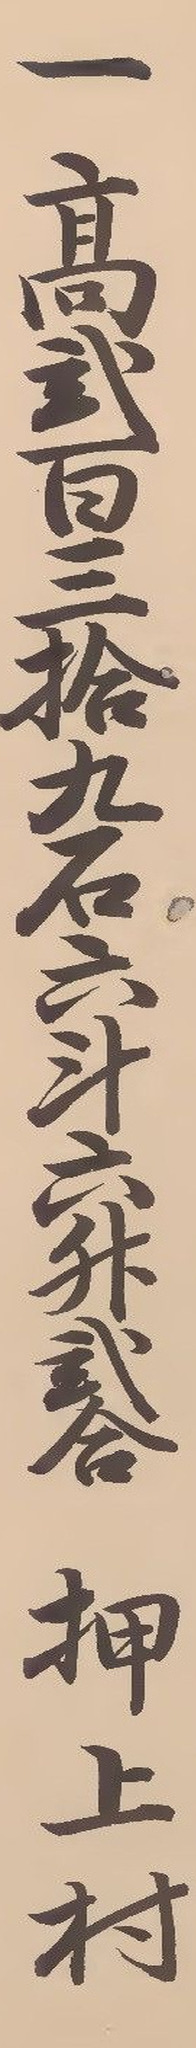一高弐百三拾九石六斗六升弐合押上村
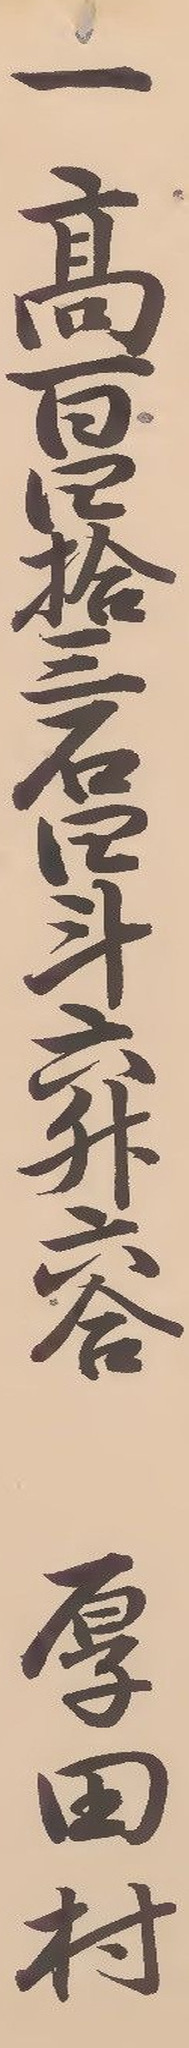一高百四拾三石四斗六升六合厚田村
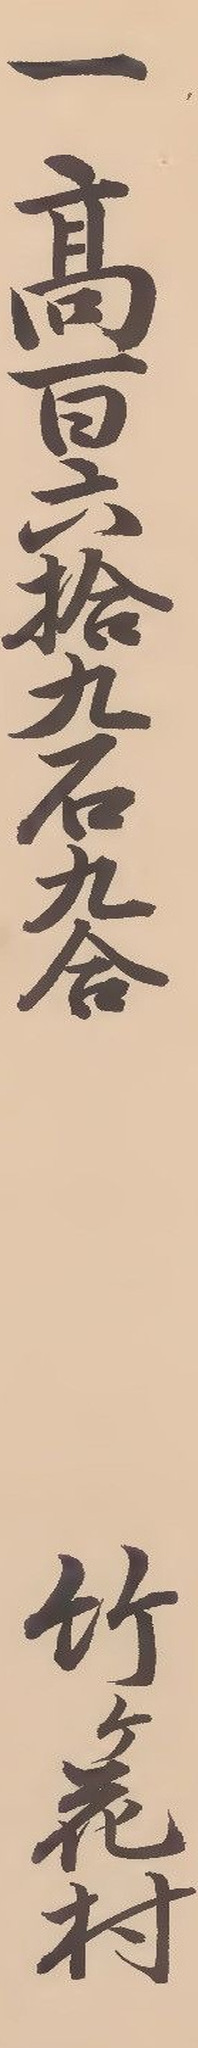一高百六拾九石九合竹ヶ花村
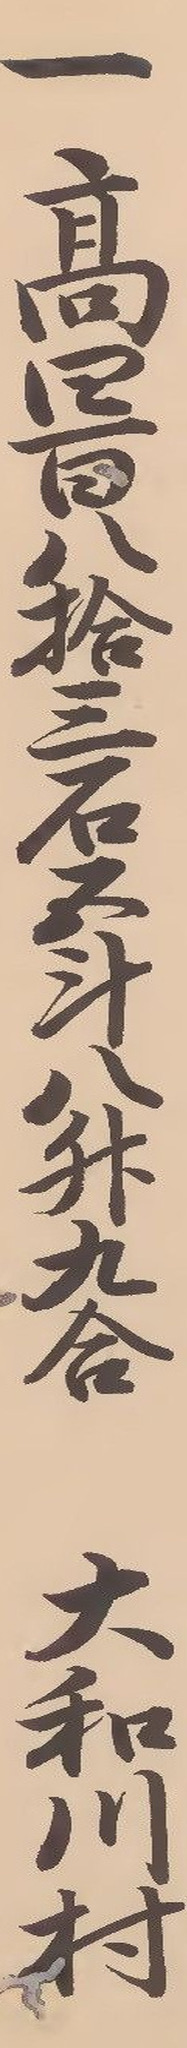一高四百八拾三石五斗八升九合大和川村

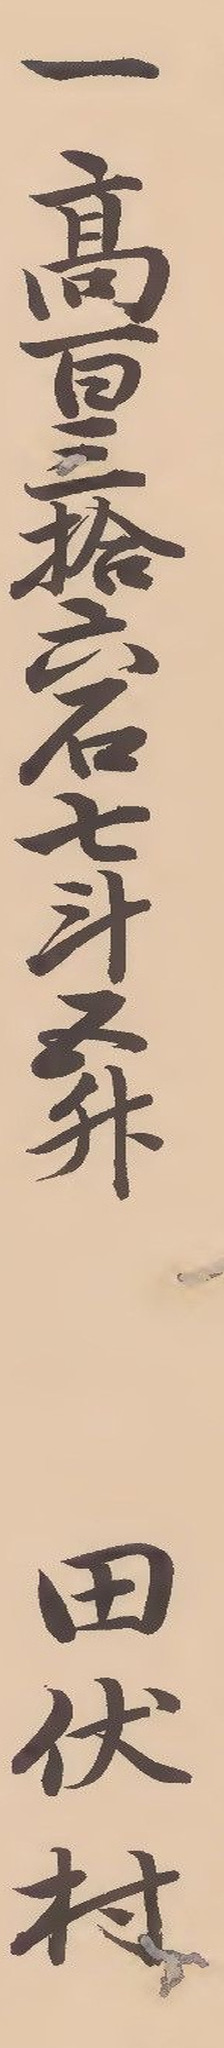一高百三拾六石七斗五升田伏村
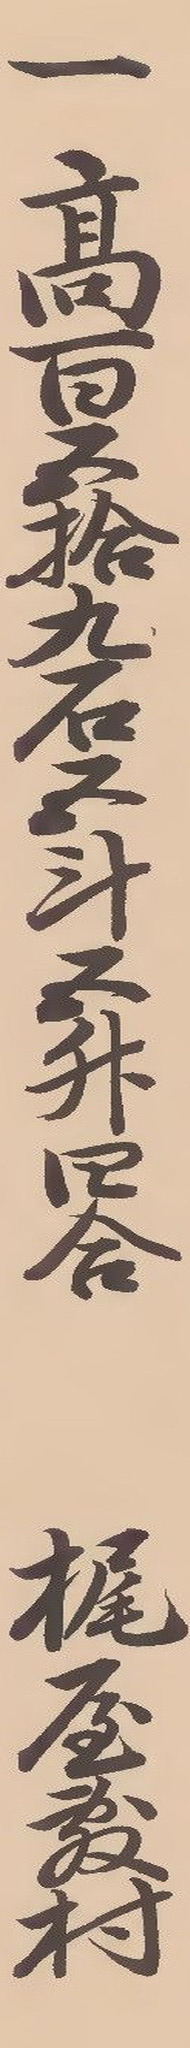一高百五拾九石五斗五升四合梶屋敷村
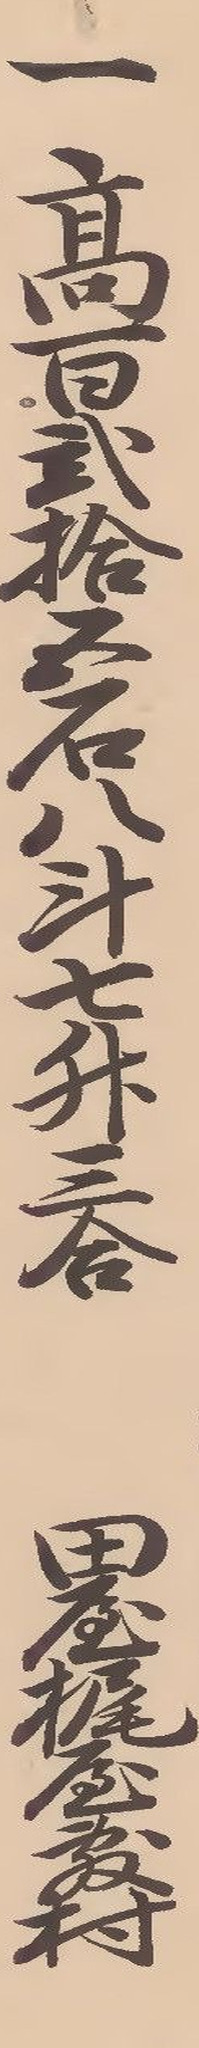一高百弐拾五石八斗七升三合田屋梶屋敷村
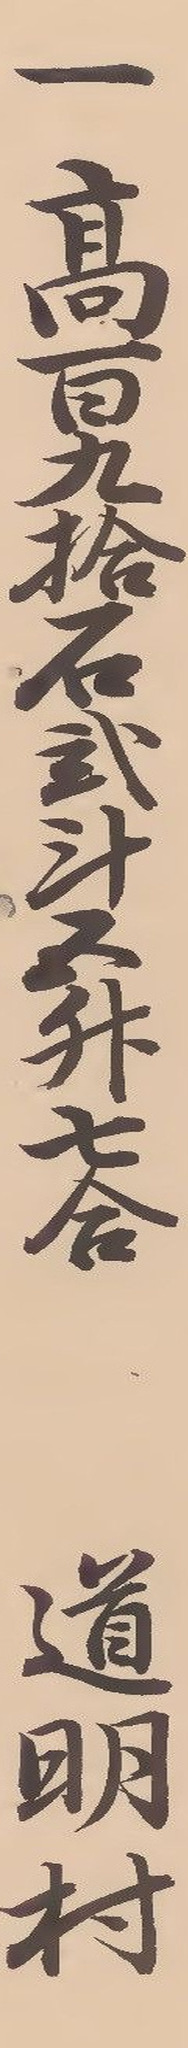一高百九拾石弐斗五升七合道明村
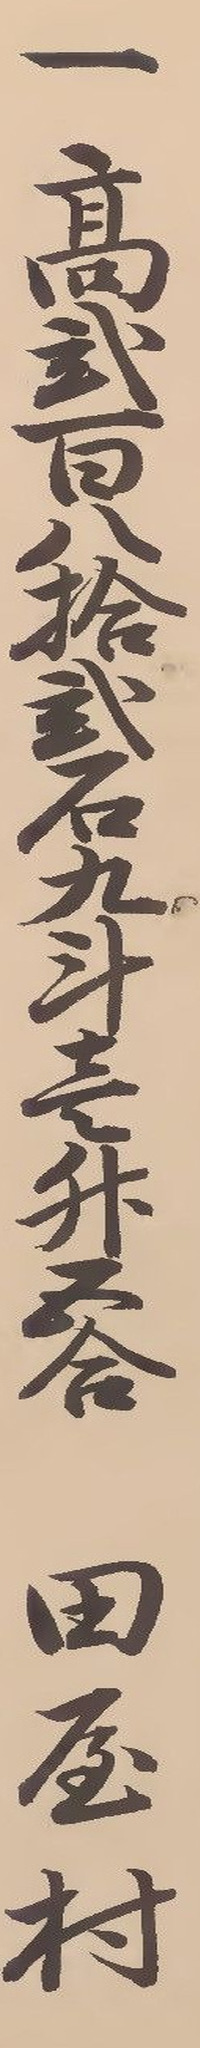一高弐百八拾弐石九斗壱升五合田屋村
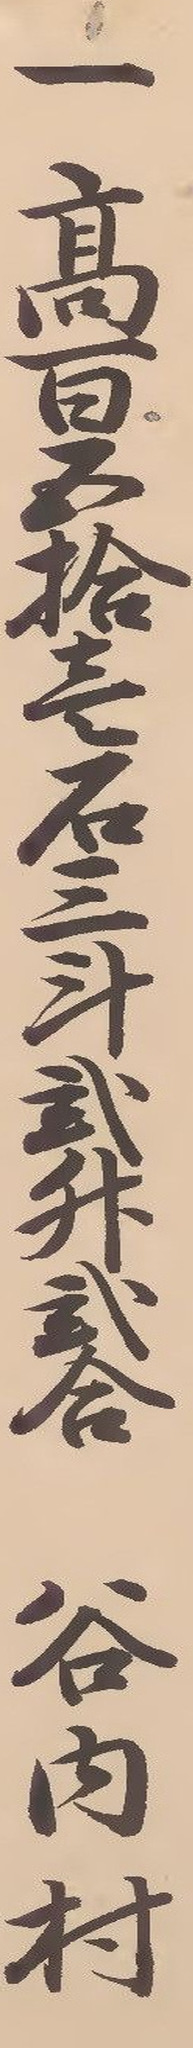一高百五拾壱石三斗弐升弐合谷内村
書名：越後国郷帳　上
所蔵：国立公文書館 National Archives of Japan
